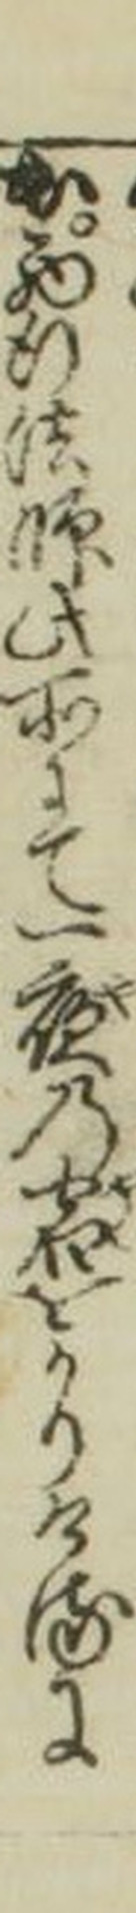出。西行法師此所にて一夜の宿をかりけるに
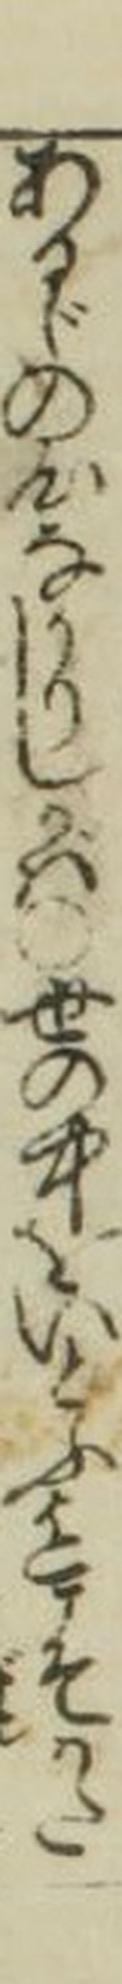あるじの心なかりしかば○世の中をいとふ迄こそかた
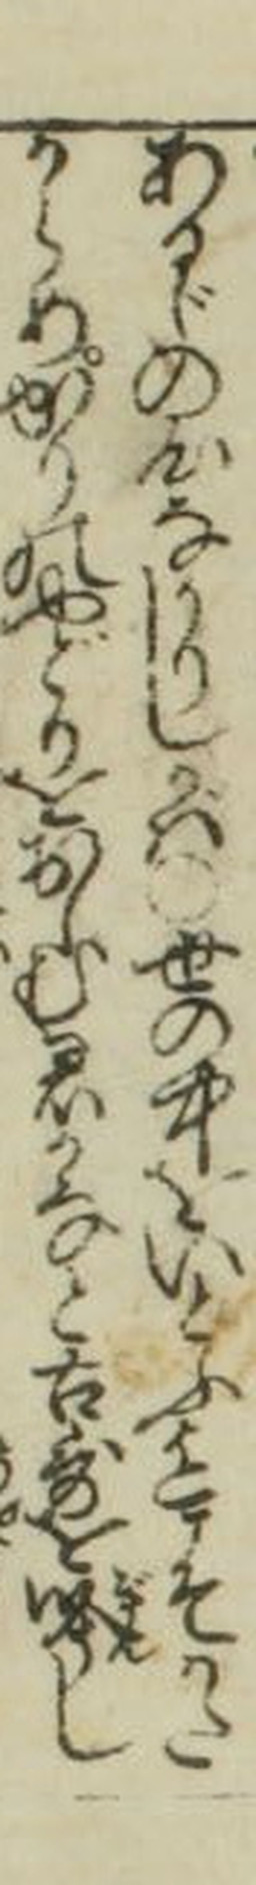からめ。かりのやどりをおしむ君かなと古哥を吟し
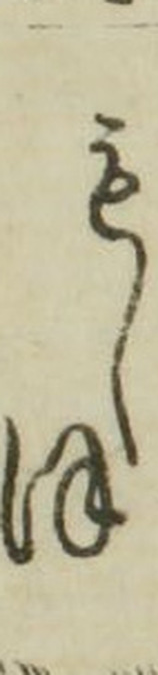もしほ
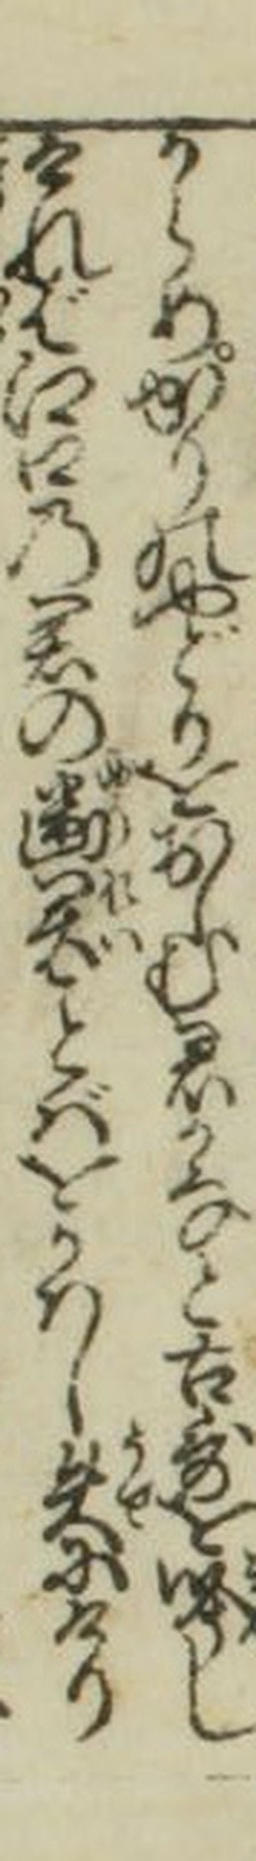ければ江口の君の幽霊ことばをかはし失にけり
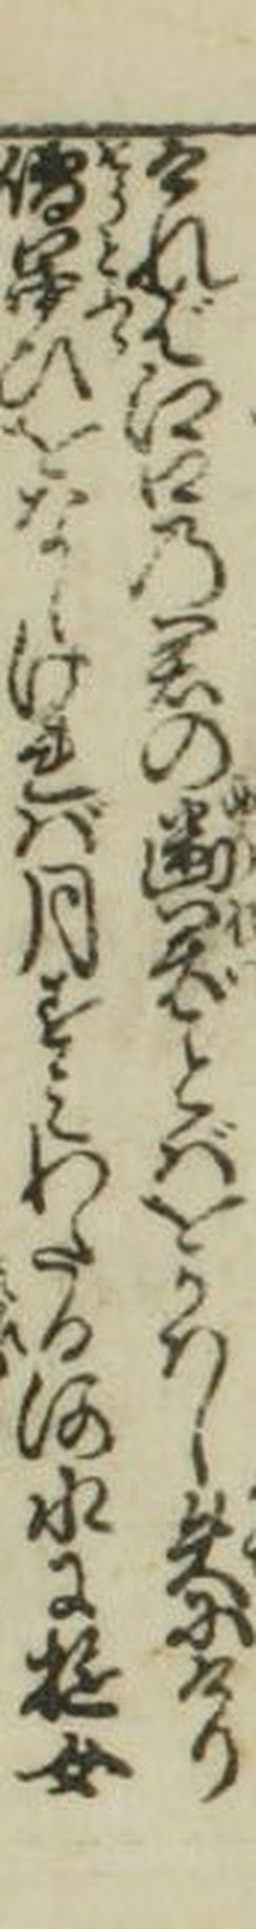僧弔ひをなしければ月すみわたる河水に遊女
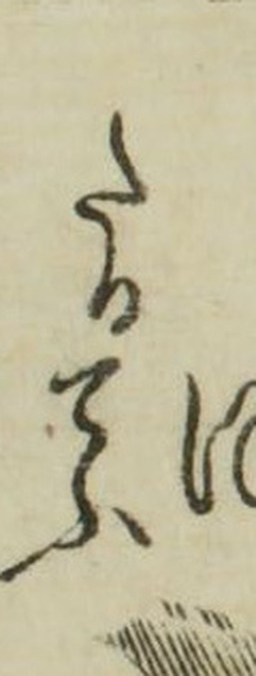たるてふ
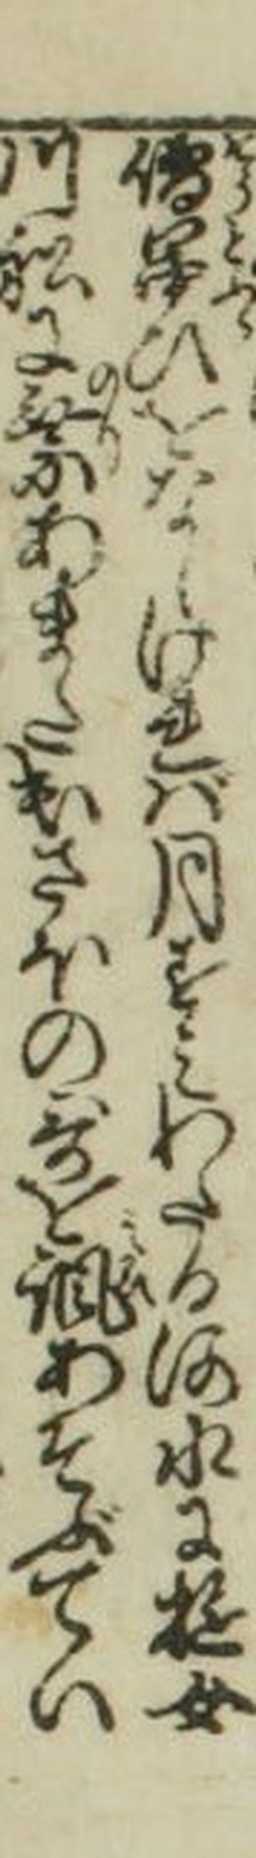川船に乗あまた出さほの哥を諷あそぶてい
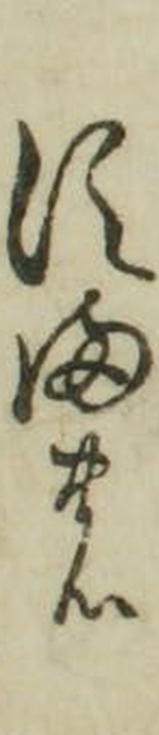すまの
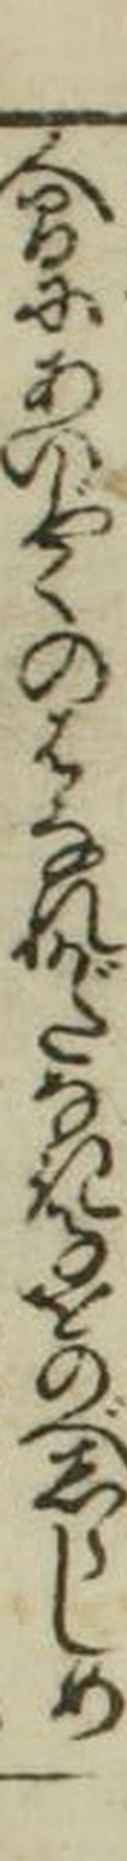人間にあいじやくのはなれがたなき事をのべしらしめ
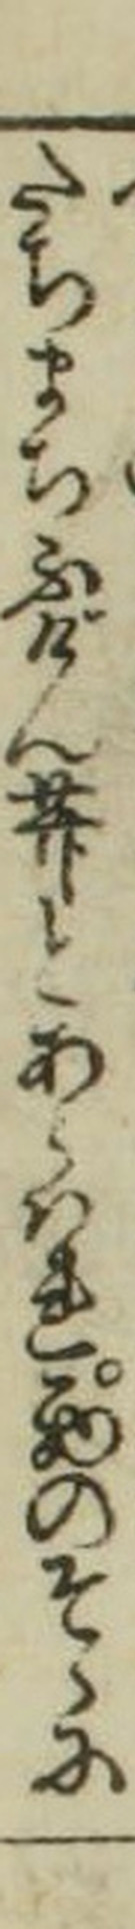たちまちふげん菩薩とあらはれ。西のそらに
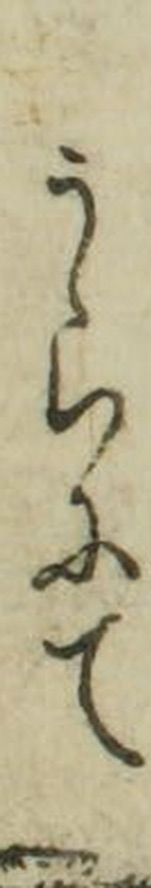うらにて
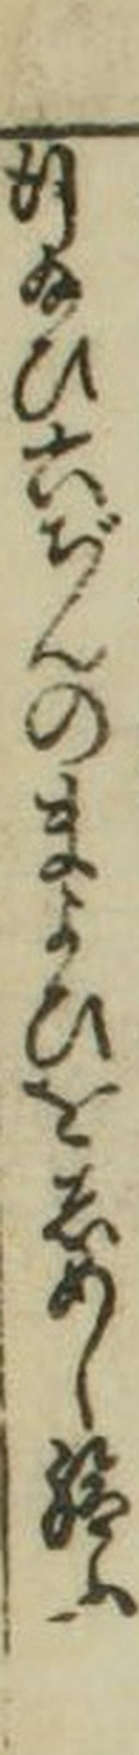行給ひ六ぢんのまよひをしめし給ふ

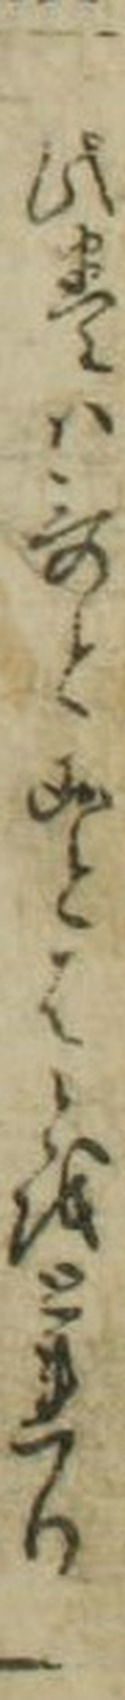此巻は哥とことはとをとれり
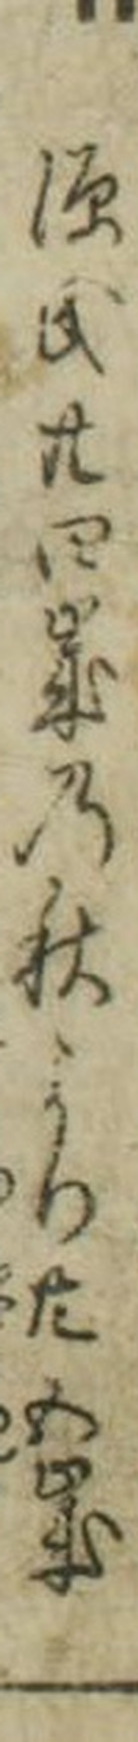源氏廿四歳の秋より廿五歳
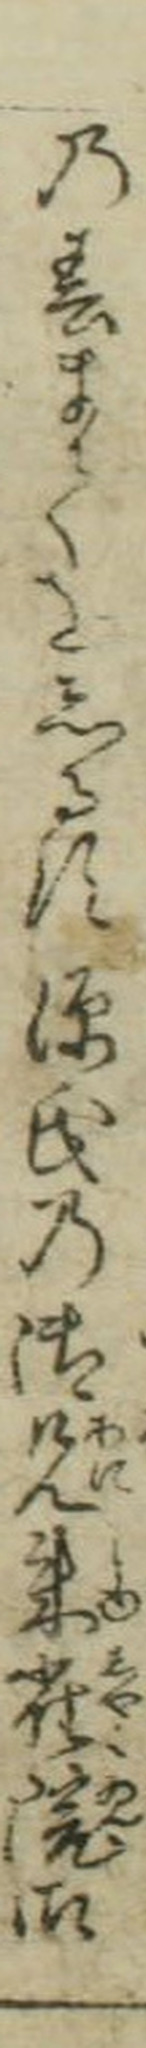の春まてをしるす。源氏の御兄朱雀院御
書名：女源氏教訓鑑
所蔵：東京学芸大学附属図書館
